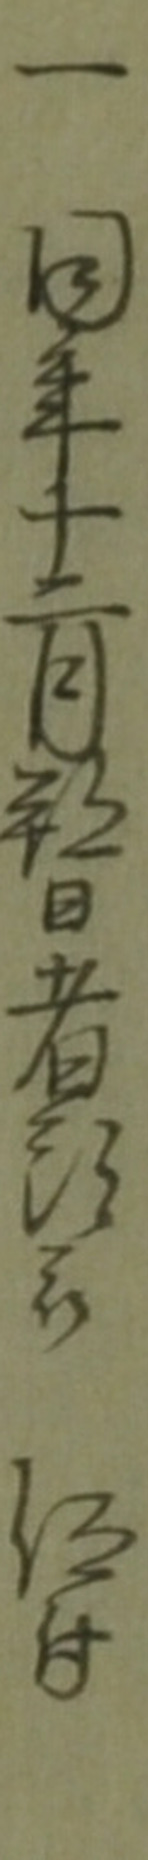一同年十二月朔日者頭被仰付
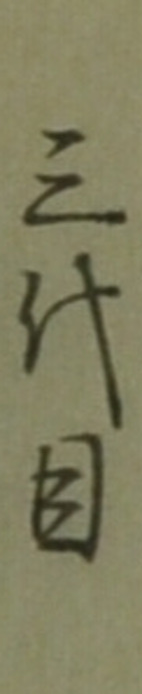三代目
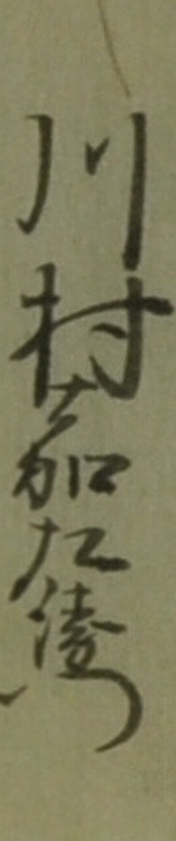川村嘉左衛門
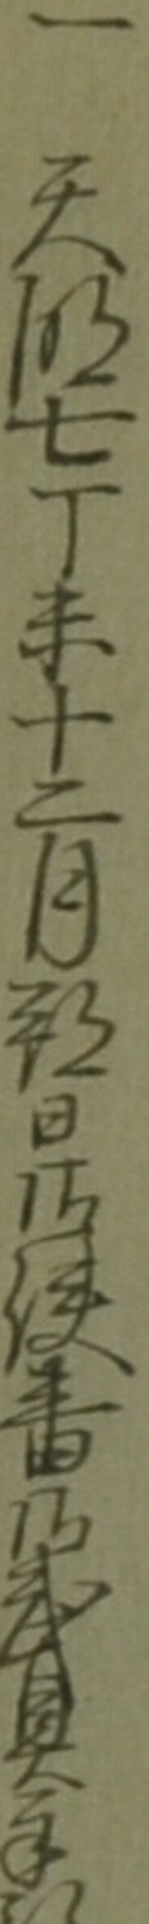一天明七丁未十二月朔日御使番御武具奉行兼
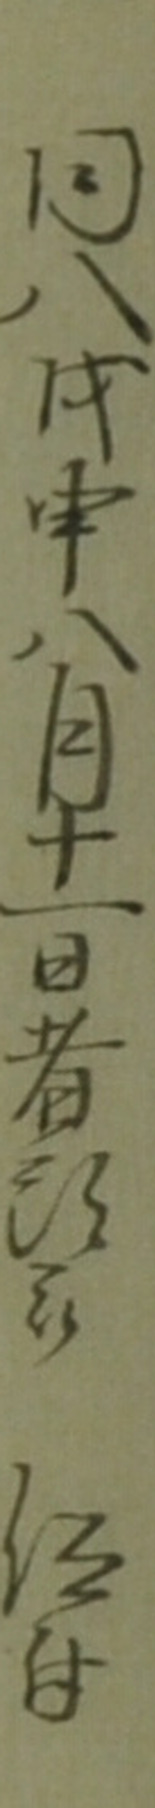一同八戊申八月十一日者頭被仰付
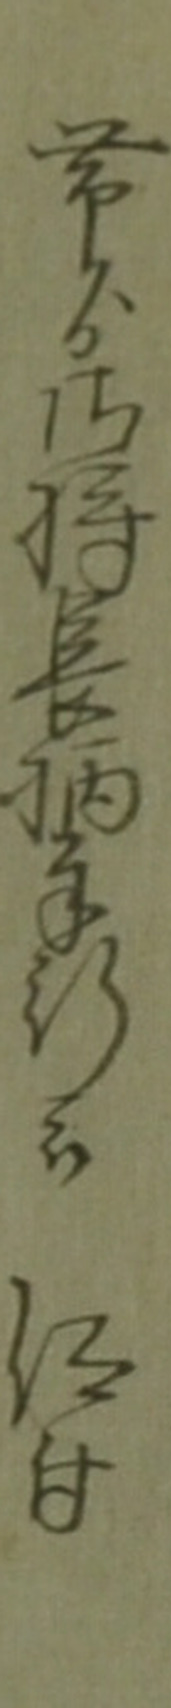帯ゟ御持長柄奉行被仰付
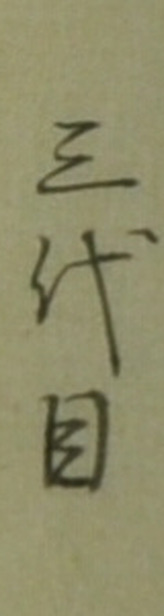三代目

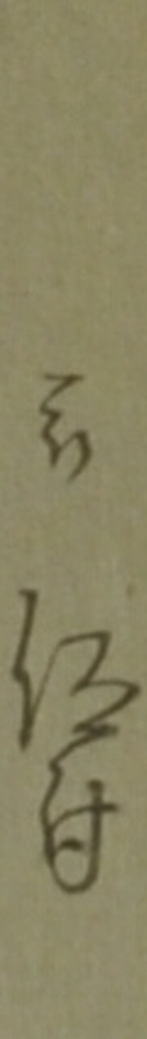被仰付
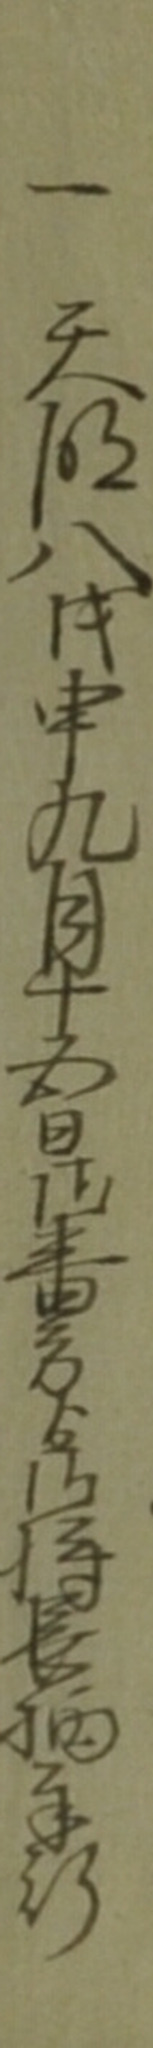一天明八戊申九月十五日御番方ゟ御持長柄奉行
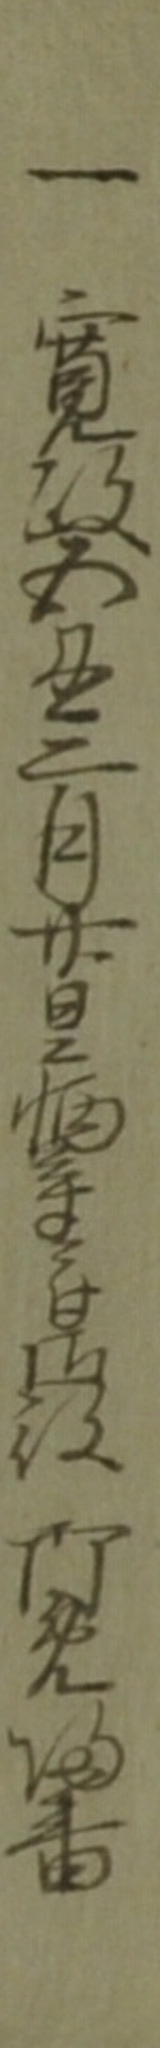一寛政五丑二月廿日病気ニ付御役御免帰番
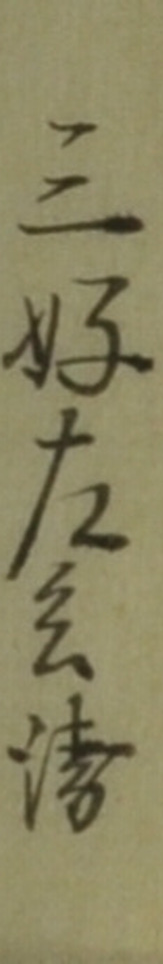三好左兵衛
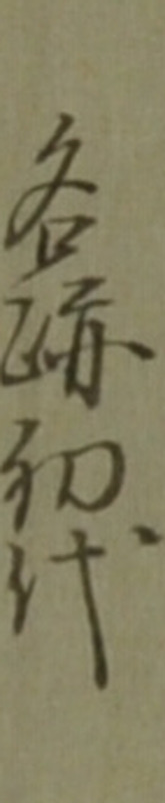名跡初代
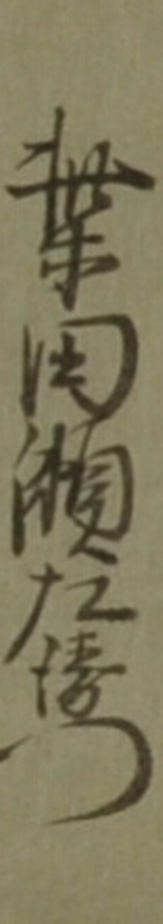柴田瀬左衛門
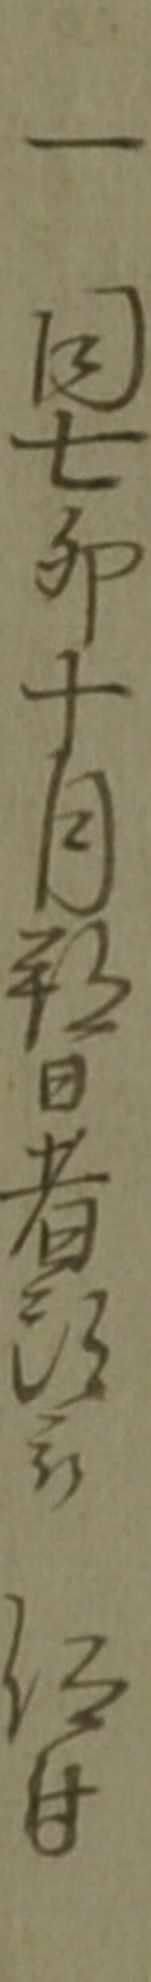一同七卯十月朔日者頭被仰付
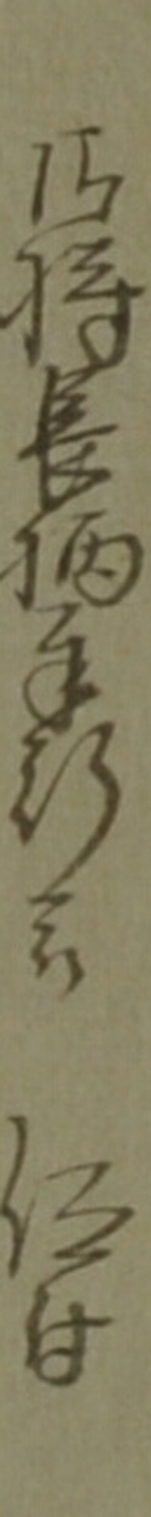御持長柄奉行被仰付
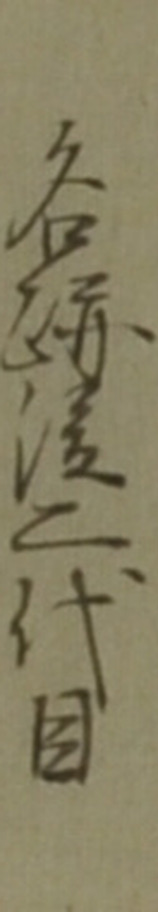名跡後二代目
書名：諸御役代々録（三）
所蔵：伊那市立高遠町図書館・合同会社AMANE
